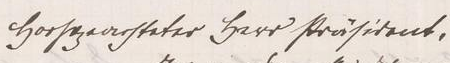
Hochgeachteter Herr Präsident,
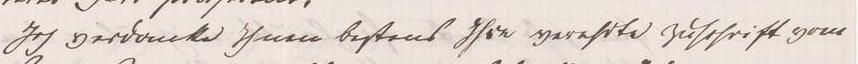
Ich verdanke Ihnen bestens Ihre verehrte Zuschrift vom
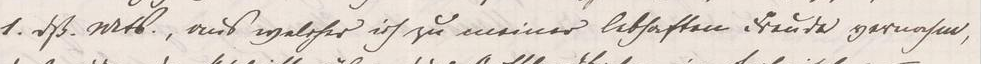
1. dß. Mts., aus welcher ich zu meiner lebhaften Freude vernahm,
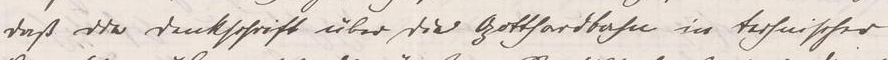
daß die Denkschrift über die Gotthardbahn in technischer
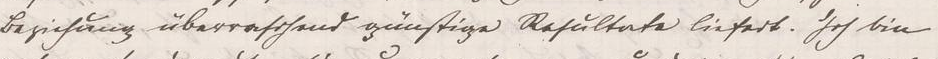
Beziehung überraschend günstige Resultate liefert. Ich bin
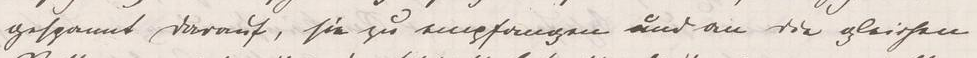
gespannt darauf, sie zu empfangen und an die gleichen
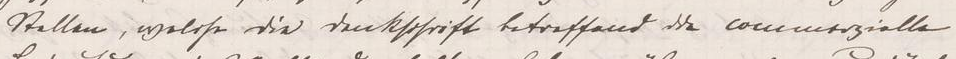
Stellen, welche die Denkschrift betreffend die commerzielle
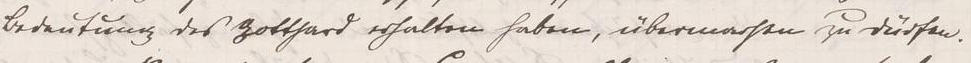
Bedeutung des Gotthard erhalten haben, übermachen zu dürfen.
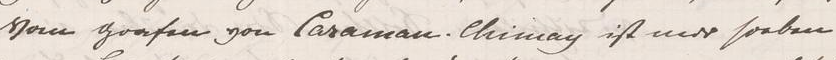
Vom Grafen von Caraman-Chimay ist mir soeben
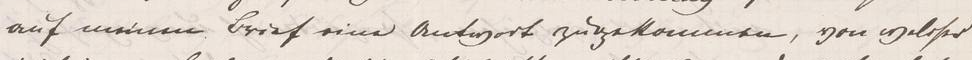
auf meinen Brief eine Antwort zugekommen, von welcher
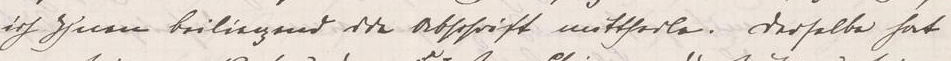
ich Ihnen beiliegend die Abschrift mittheile. Derselbe hat
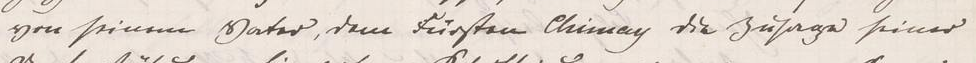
von seinem Vater, dem Fürsten Chimay die Zusage seiner
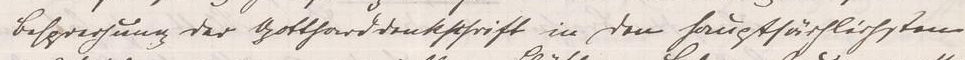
Besprechung der Gotthard Denkschrift in den hauptsächlichsten
